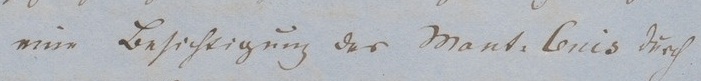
eine Besichtigung des Mont–Cenis durch
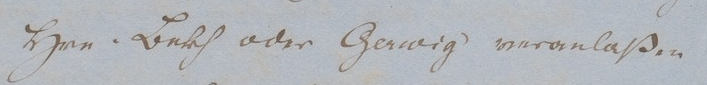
Hrn. Bekh oder Gerwig veranlaßen
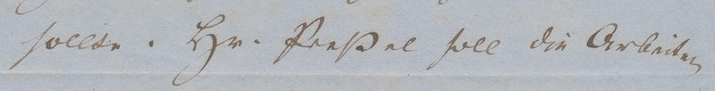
sollte. Hr. Preßel soll die Arbeiten
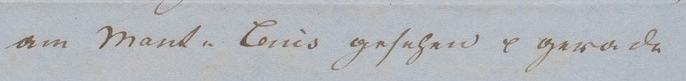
am Mont–Cenis gesehen & gerade
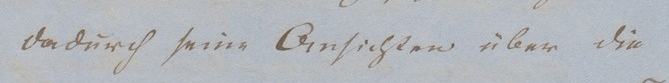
dadurch seine Ansichten über die
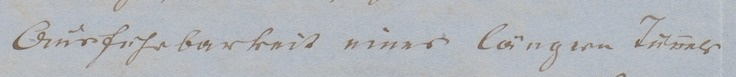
Ausführbarkeit eines längern Tunnels
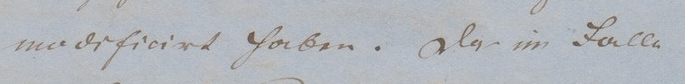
modificirt haben. Da im Falle
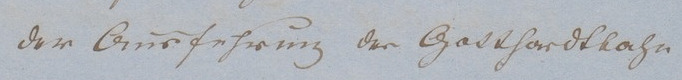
der Ausführung der Gotthardtbahn
